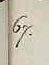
67.
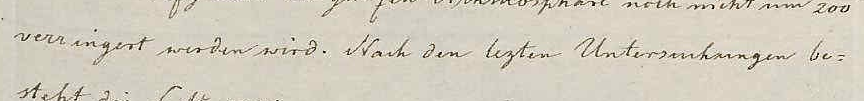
verringert werden wird. Nach den lezten Untersuchungen be-
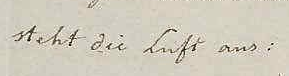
steht die Luft aus:
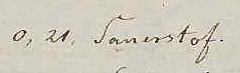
0,21 Sauerstof.
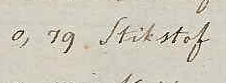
0,79 Stikstof
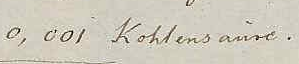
0,001 Kohlensäure.
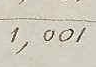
1,001
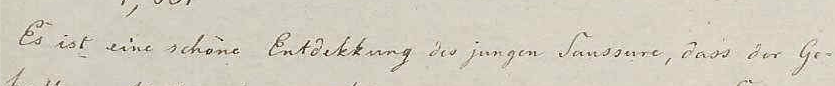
Es ist eine schöne Entdekkung des jungen Saussure, dass der Ge-
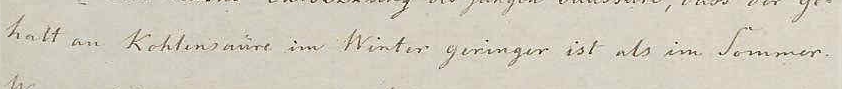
halt an Kohlensäure im Winter geringer ist als im Sommer.
